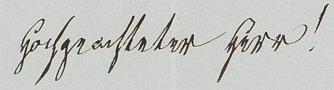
Hochgeachteter Herr!
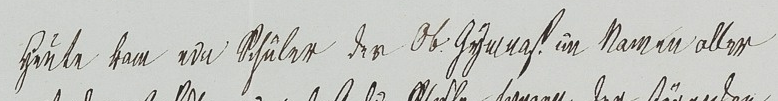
Heute kam ein Schüler des Ob. Gymnas. im Namen aller
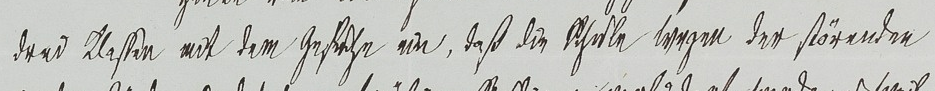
drei Klassen mit dem Gesuche ein, daß die Schule wegen der störenden
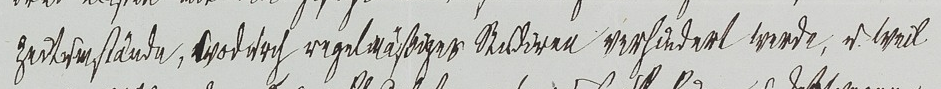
Zeitumstände, wodurch regelmäßiges Studiren verhindert werde, u. weil
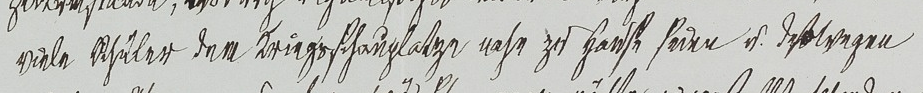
viele Schüler dem Kriegsschauplatze nahe zu Hause seien u. deswegen
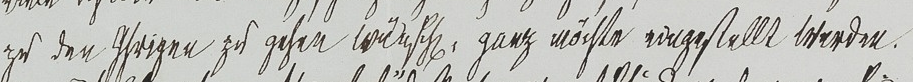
zu den Ihrigen zu gehen wünschen, ganz möchte eingestellt werden.
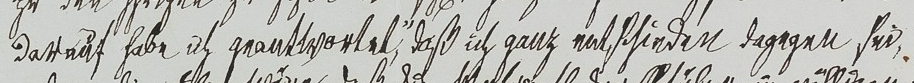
Darauf habe ich geantwortet, «daß ich ganz entschieden dagegen sei,
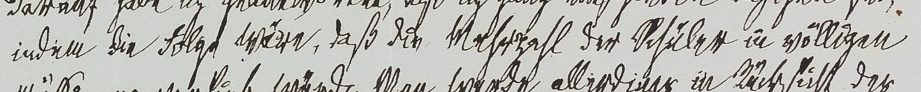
indem die Folge wäre, daß die Mehrzahl der Schüler in völligen
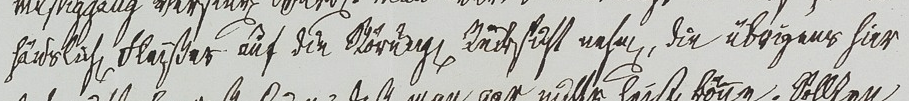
häuslichen Fleißes auf die Störungen Rücksicht nehmen, die übrigens hier
